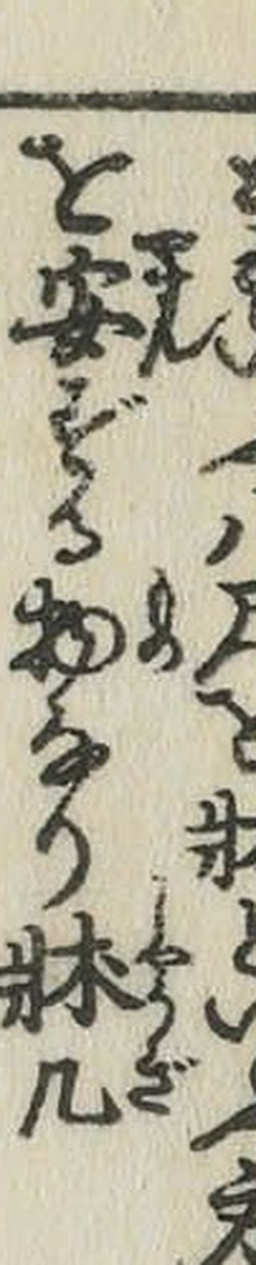を安ずる物なり牀几
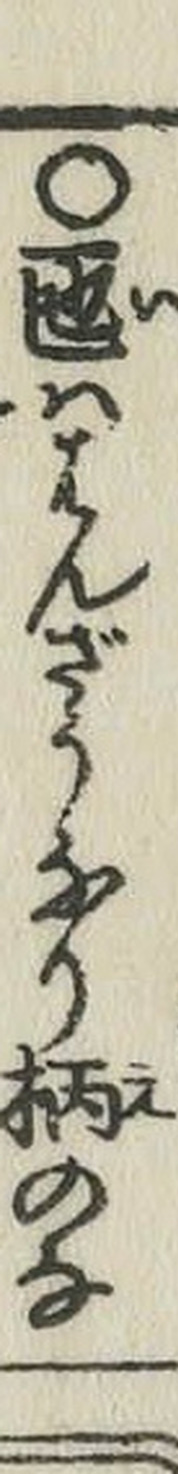○匜ははんざうなり柄のな
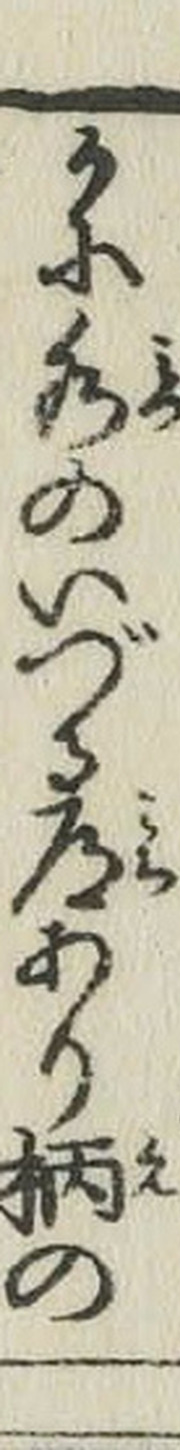かに水のいづる道あり柄の
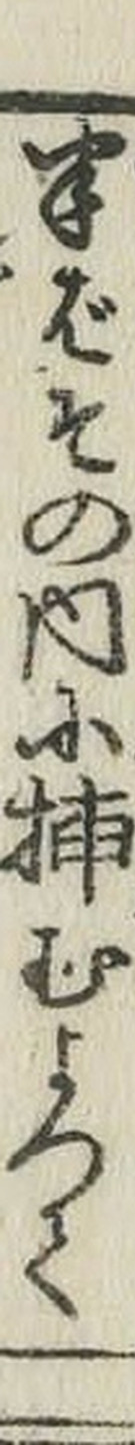半ばその内に挿むよつて
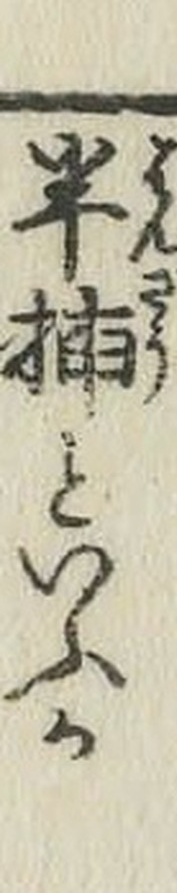半挿といふか
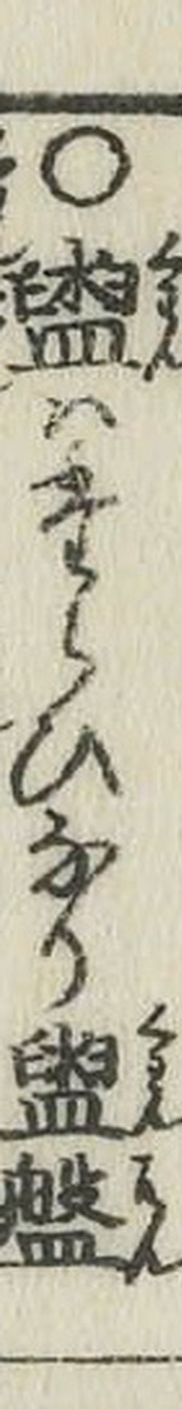○盥はたらひなり盥盤
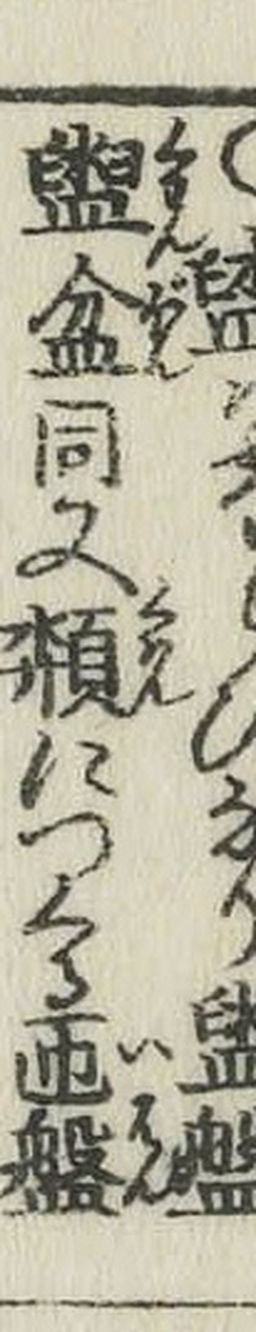盥盆同又頮につくる匝盤
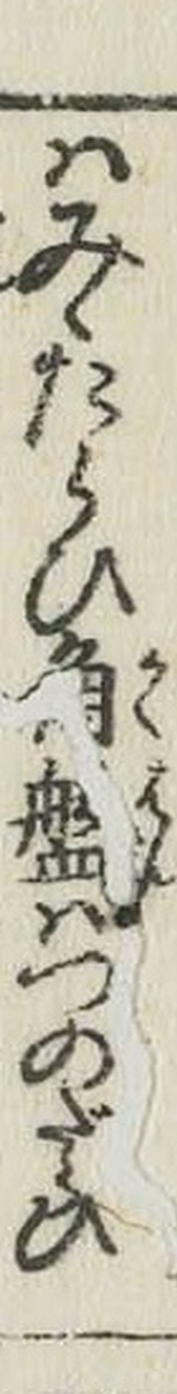はみゝたらひ角盤はつのだらひ
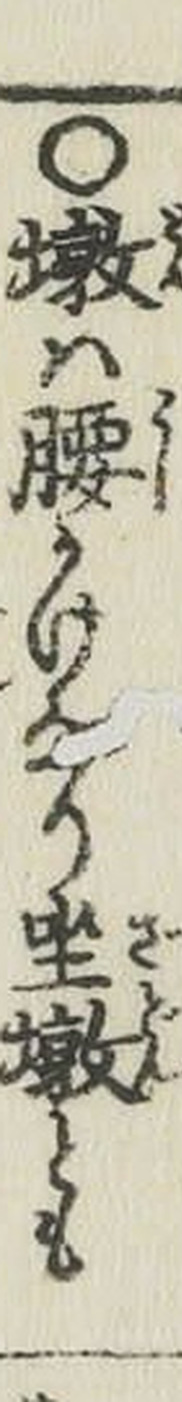○墩は腰かけなり坐墩とも
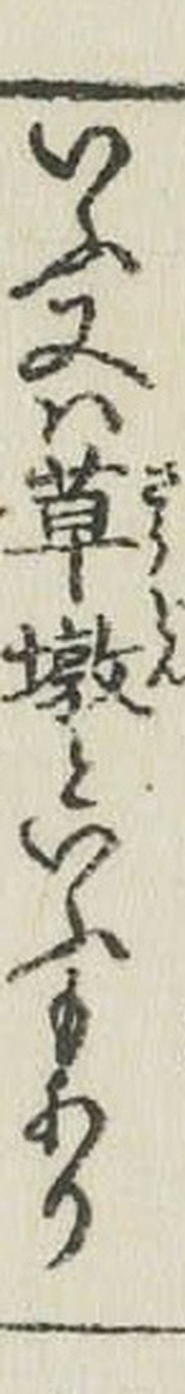いふ又は草墩といふもあり
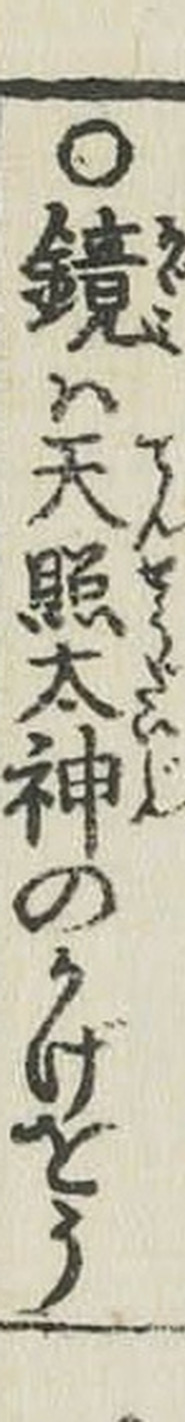○鏡は天照太神のかげをう
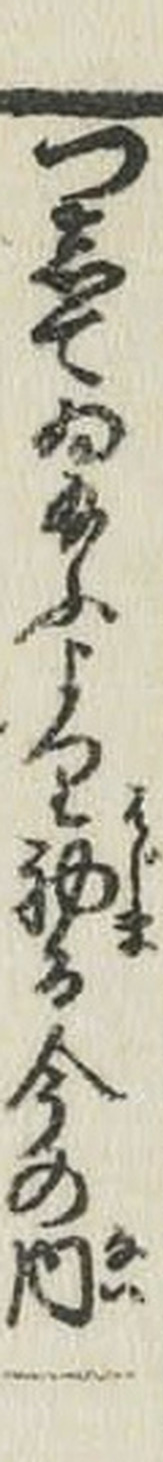つしてゐ給ふより初る今の内
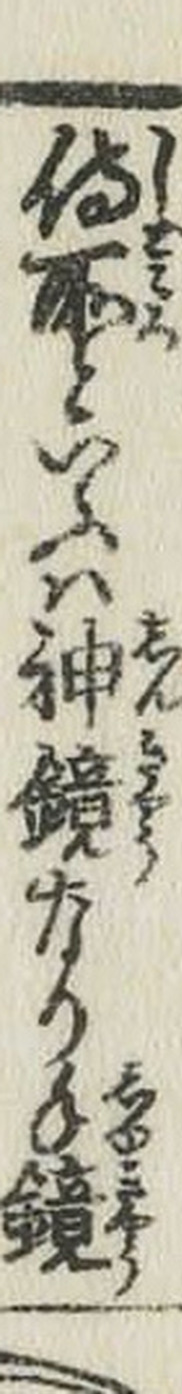侍所といふは神鏡なり手鏡
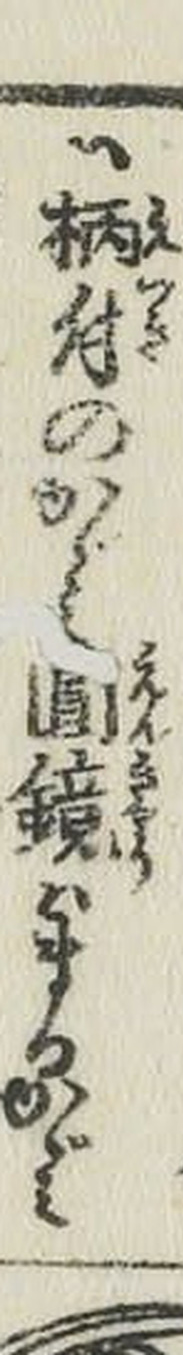は柄付のかゞみ円鏡はまるかゞみ
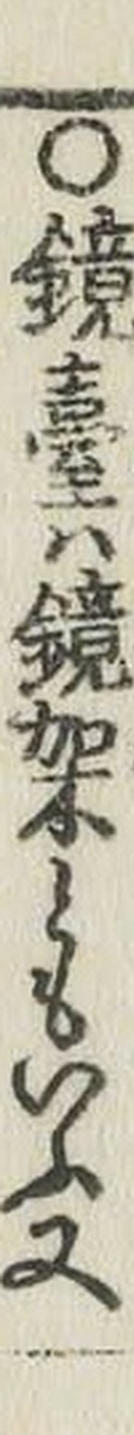○鏡台は鏡架ともいふ又
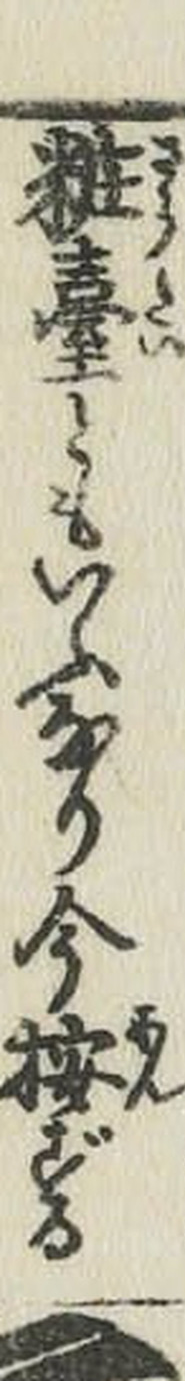粧台ともいふなり今按ずる
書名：増補頭書訓蒙図彙大成 10巻 5:巻之9-11
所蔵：東京学芸大学教育コンテンツアーカイブ
